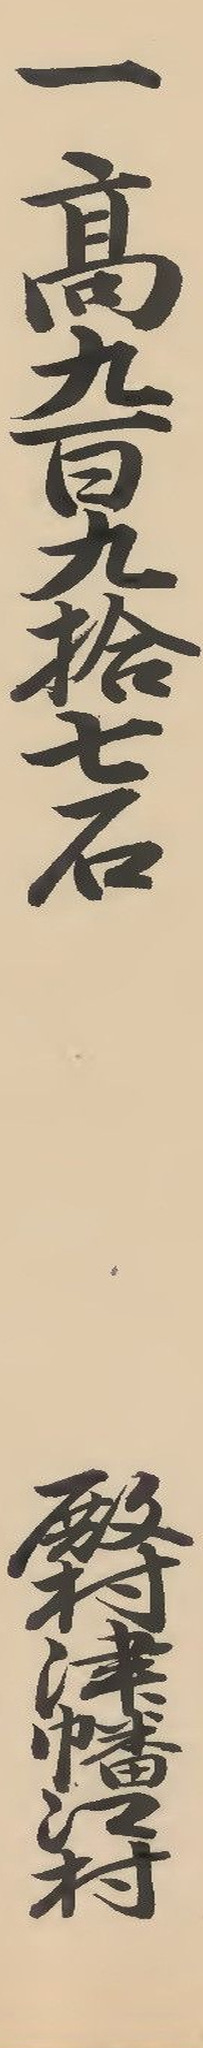一高九百九拾七石殿村津幡江村
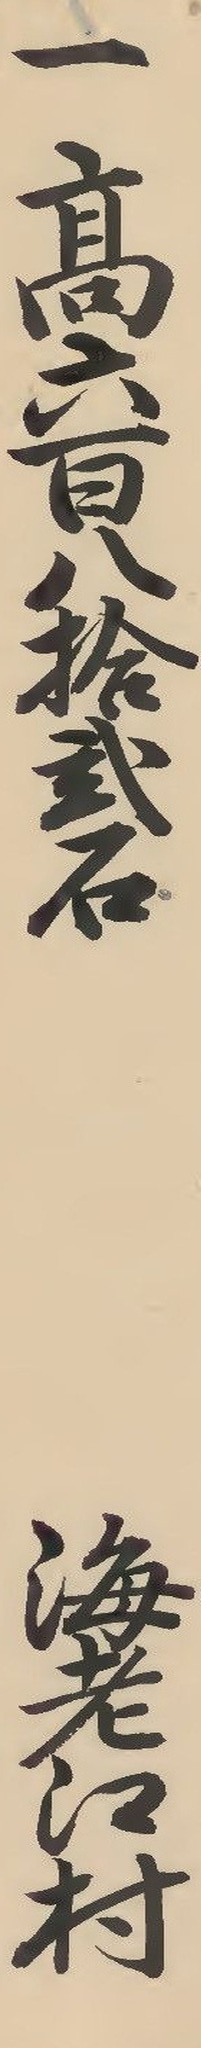一高六百八拾弐石海老江村

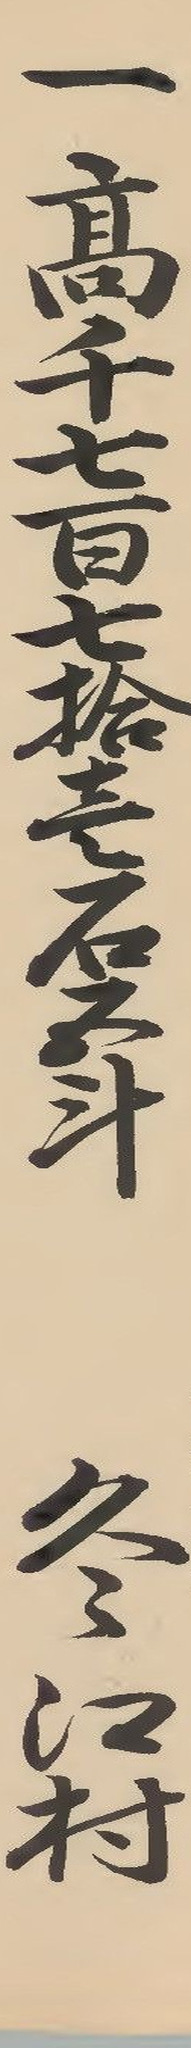一高千百五拾五石久々湊村
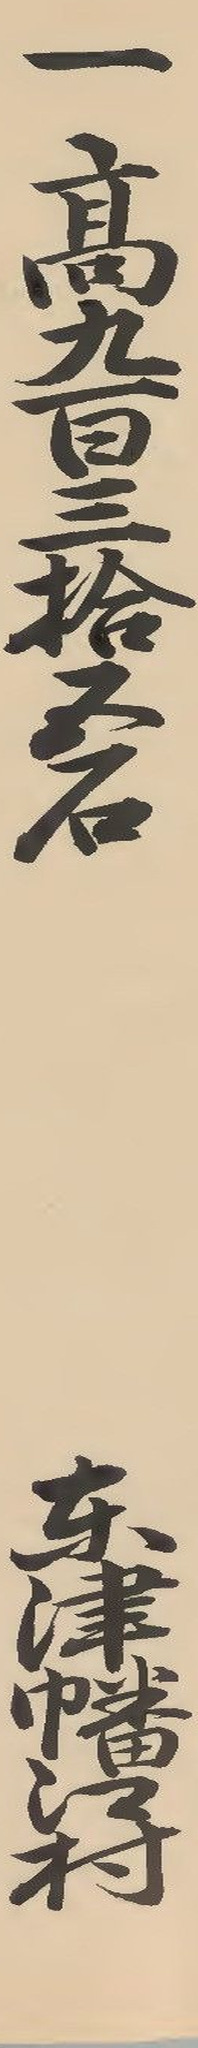一高九百三拾五石東津幡江村
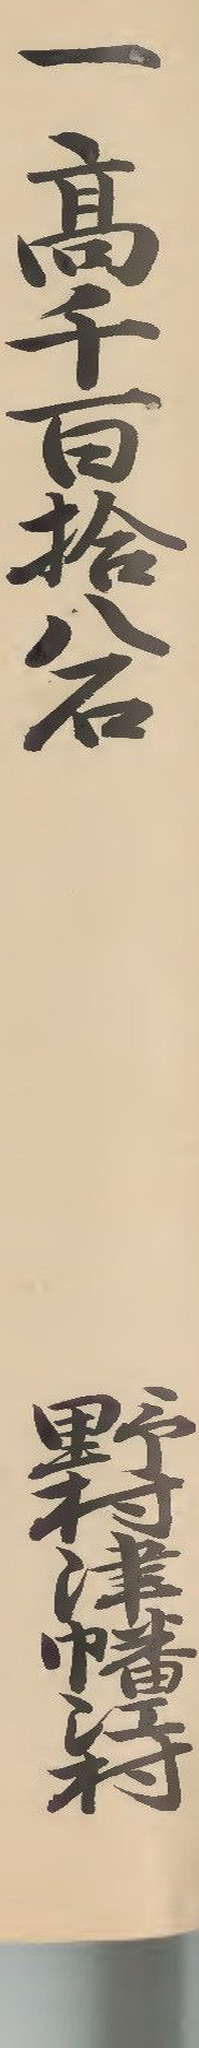一高千百拾八石野村津幡江村
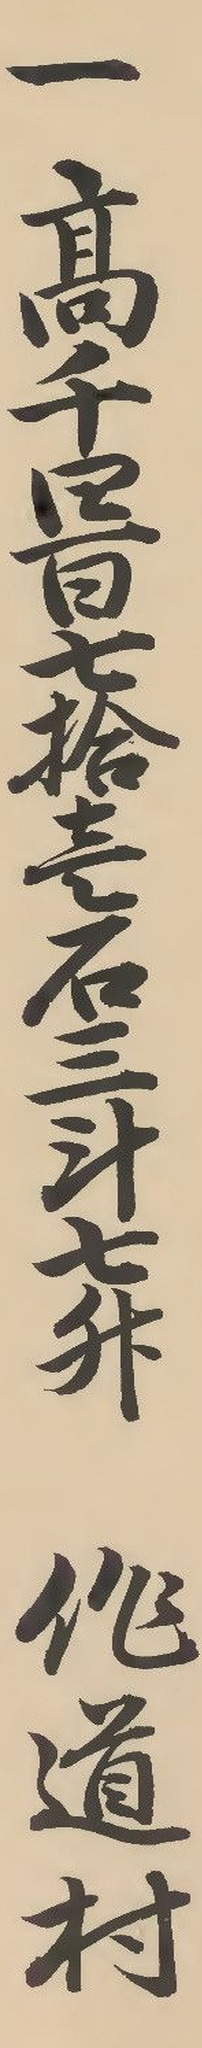一高千四百七拾壱石三斗七升作道村
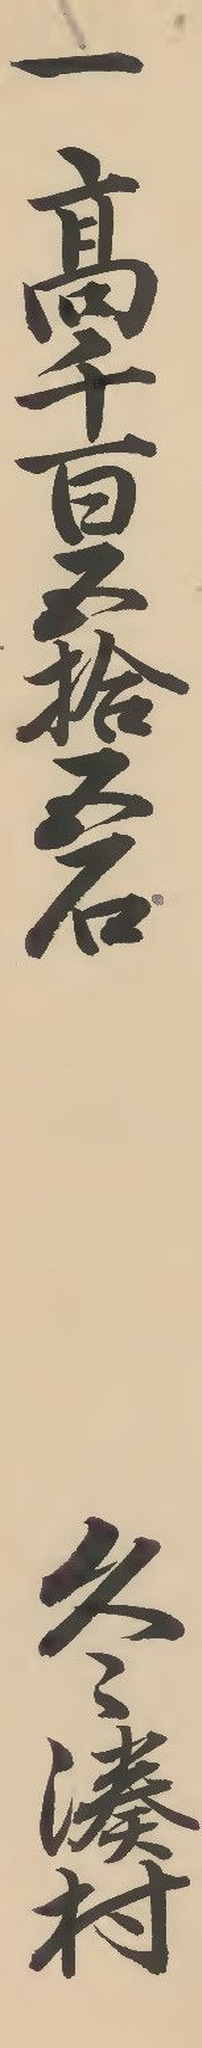一高千百五拾五石久々湊村

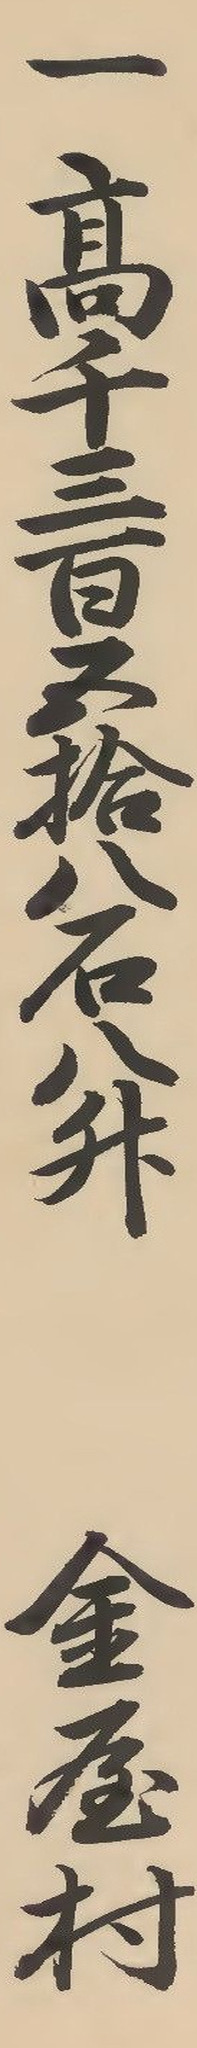一高千三百五拾八石八升金屋村
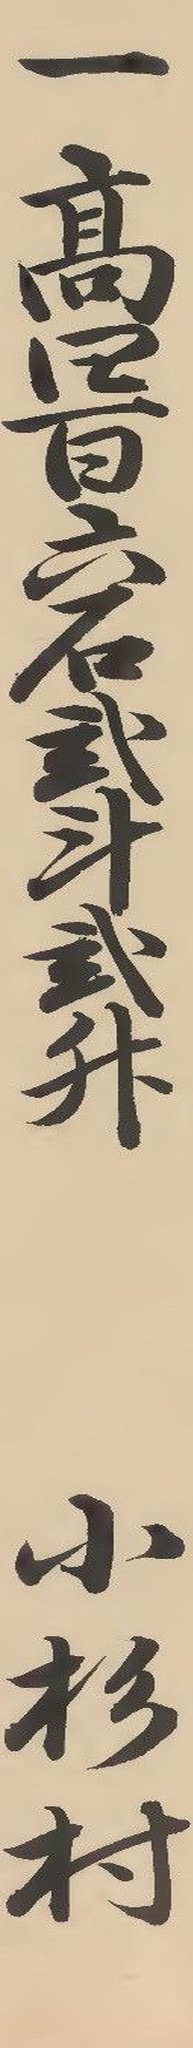一高四百六石弐斗弐升小杉村
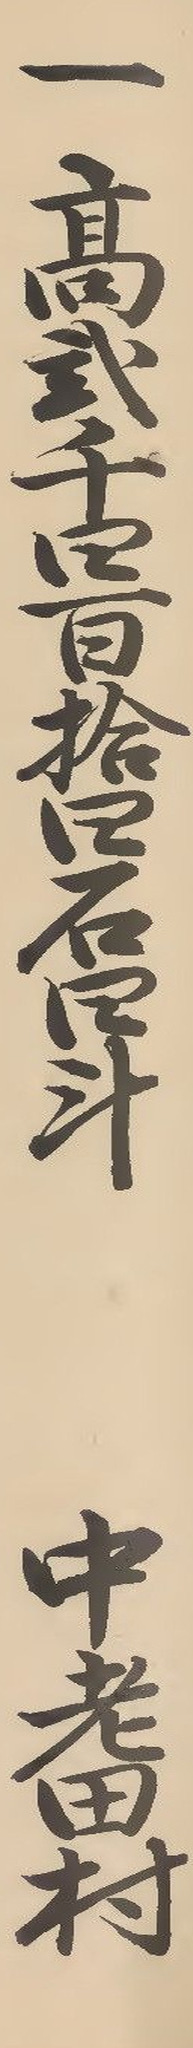一高弐千四百拾四石四斗中老田村
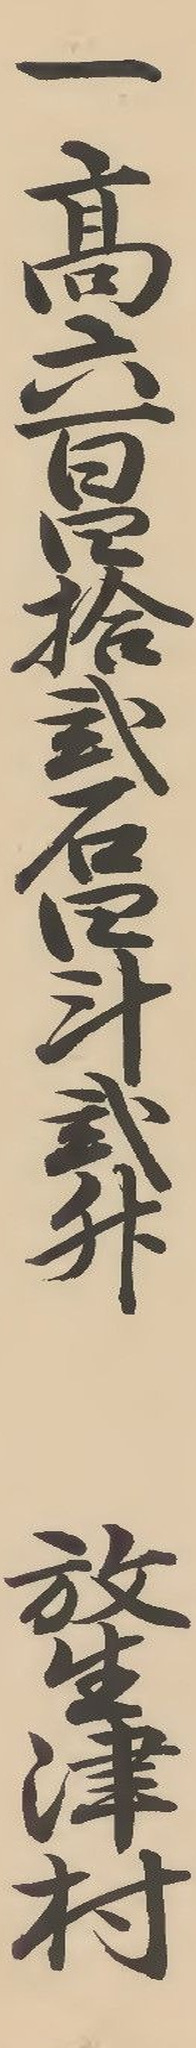一高六百四拾弐石四斗弐升放生津村
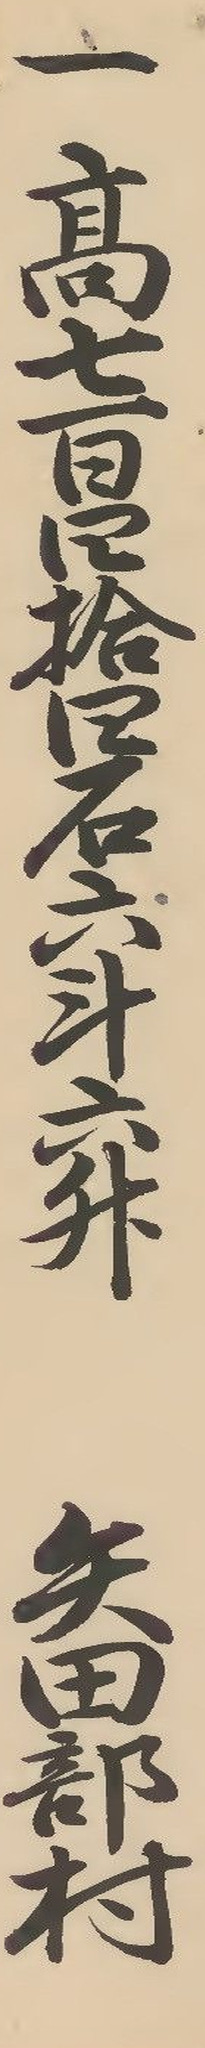一高七百四拾四石六斗六升矢田部村

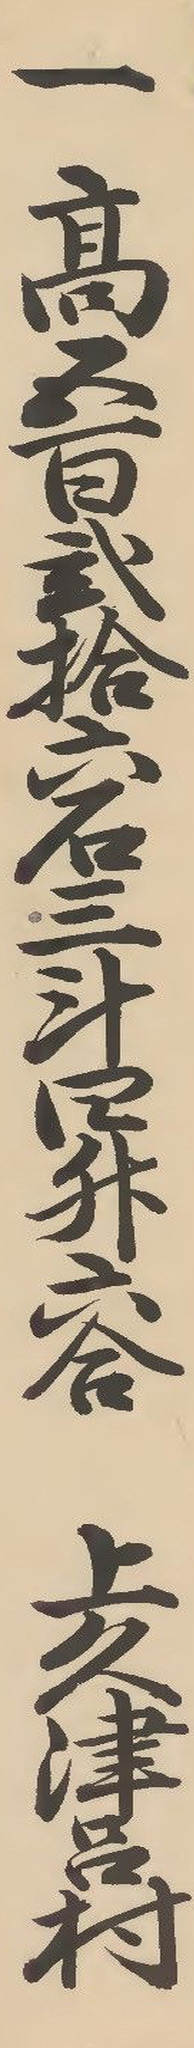一高五百弐拾六石三斗四升六合上久津呂村
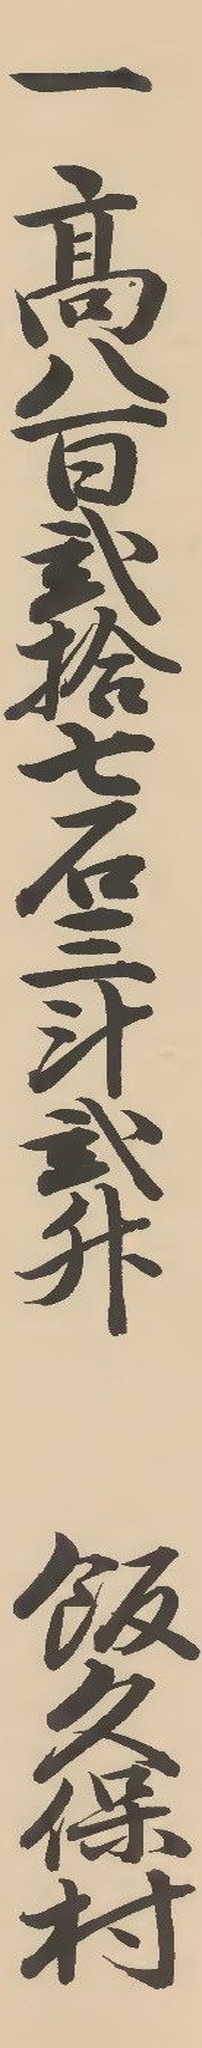一高八百弐拾七石三斗弐升飯久保村
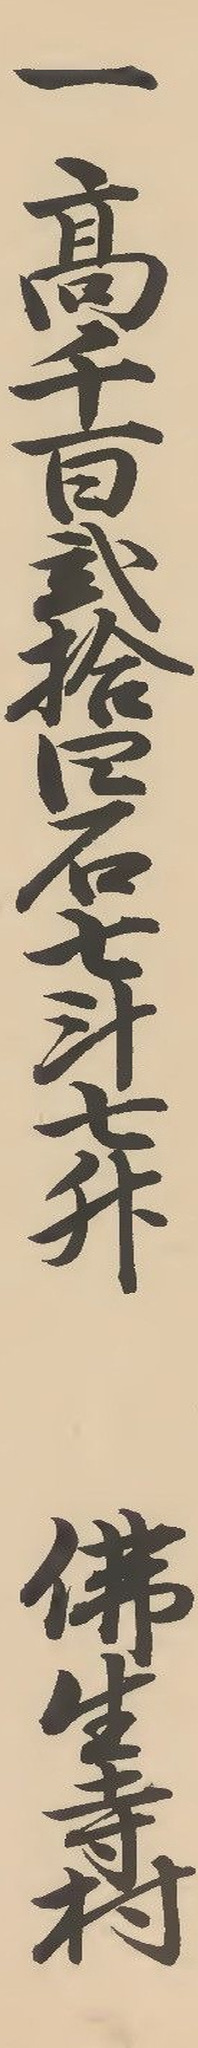一高千百弐拾四石七斗七升仏生寺村
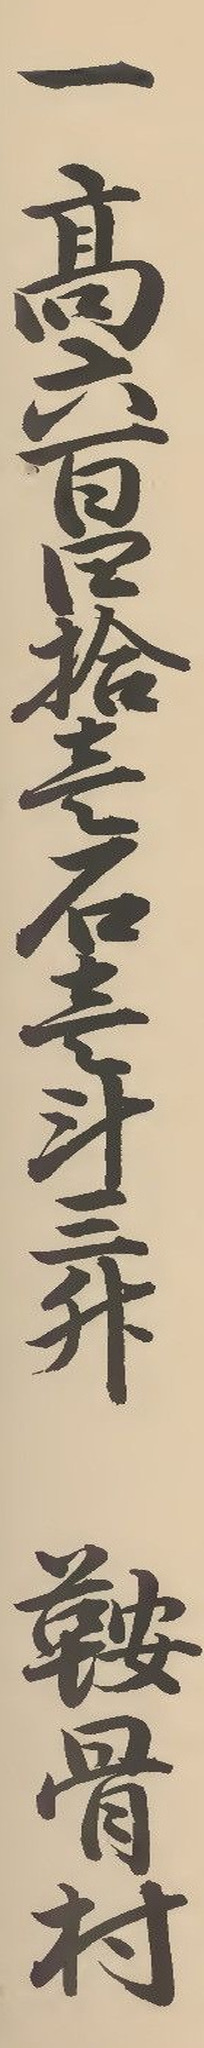一高六百四拾壱石壱斗三升鞍骨村
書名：越中国郷帳
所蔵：国立公文書館 National Archives of Japan
